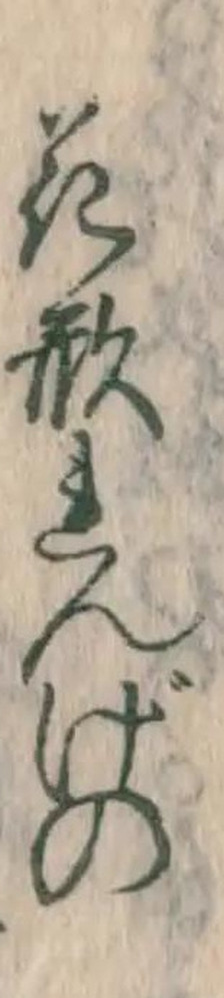花形れんげの
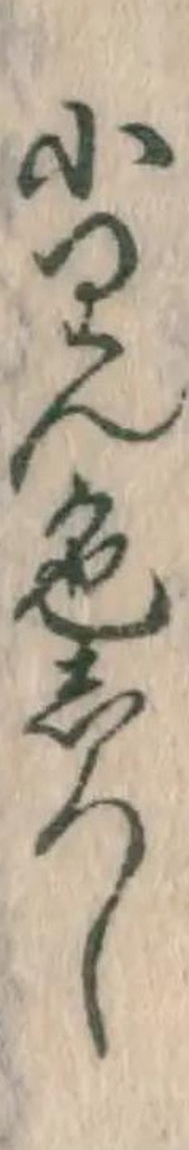小りん色しろく
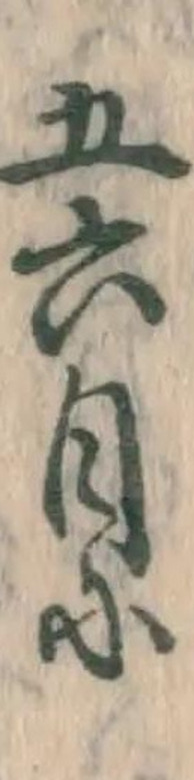五六月に
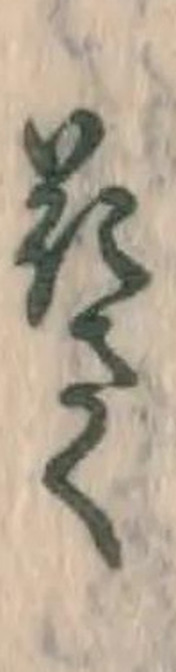花さく
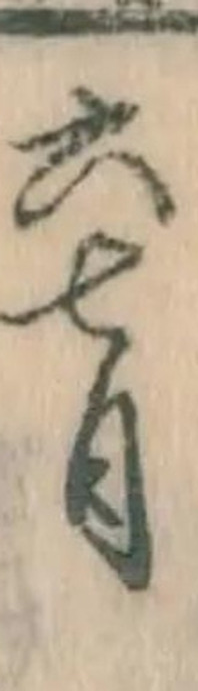六七月
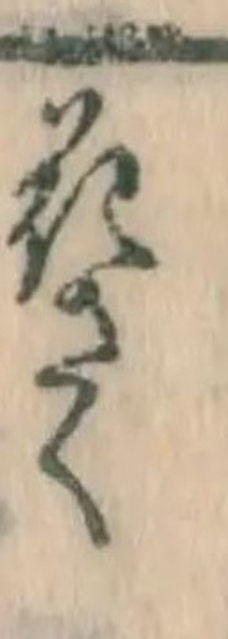花さく

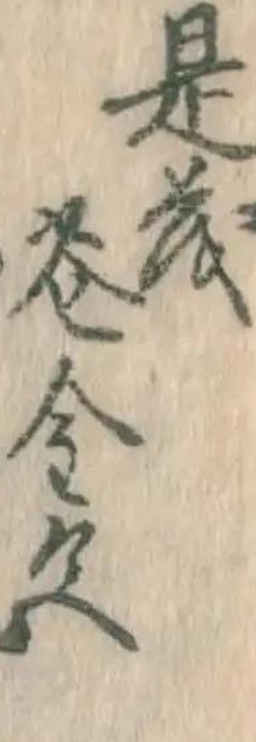花金色
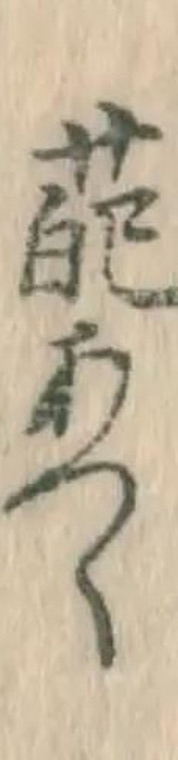葩あつく
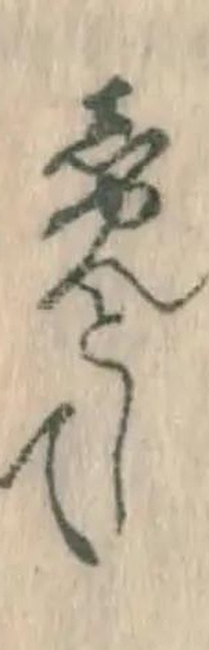しゆんとして
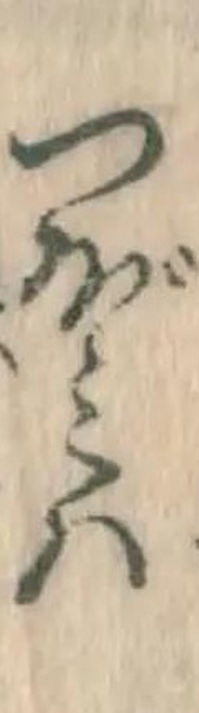つぼみは
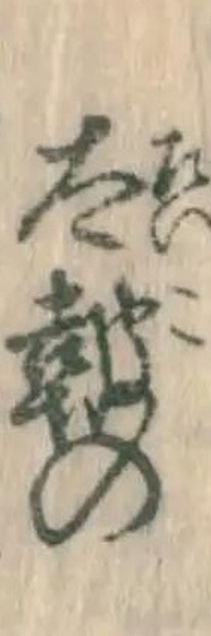太皷の
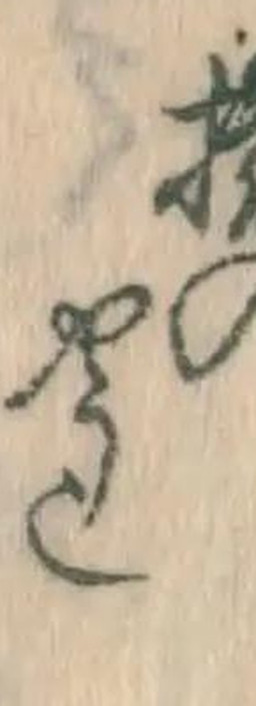やう也
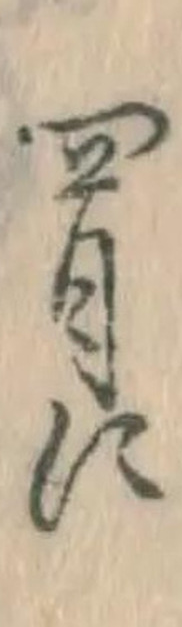四月に
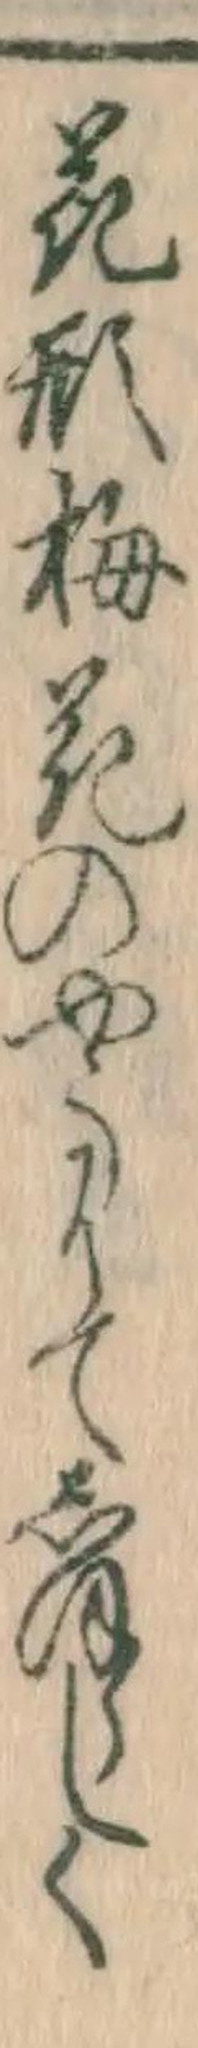花形梅花のやにてしほらしく
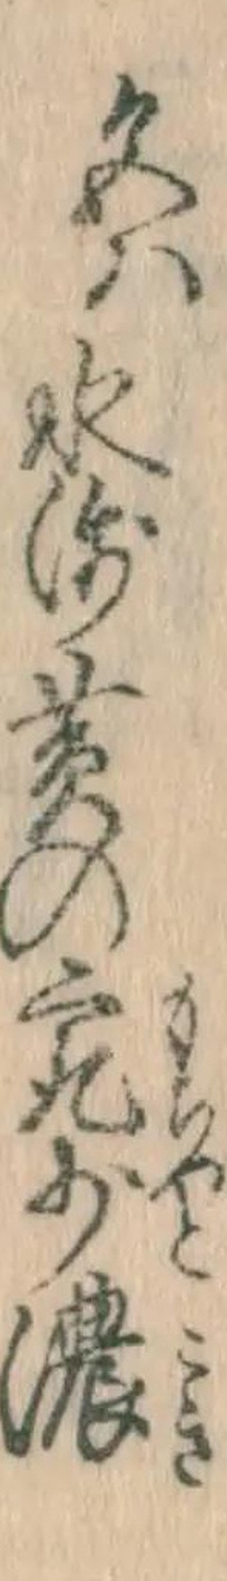色は水浅黄の最少濃
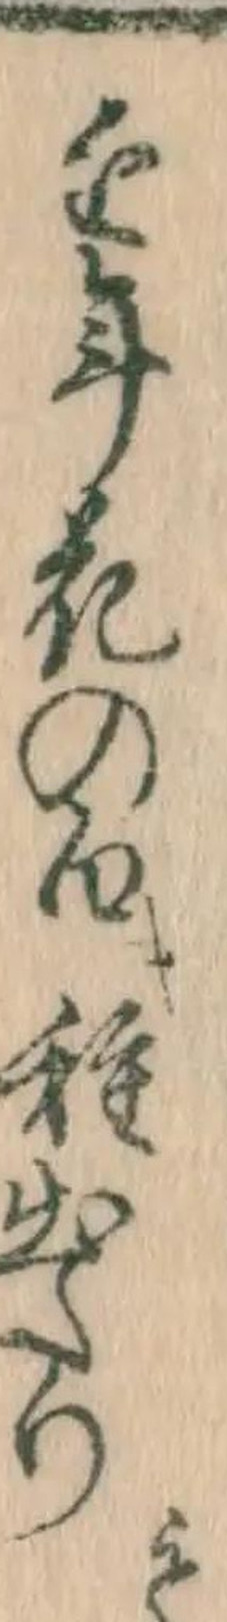近年花の白き種出たり
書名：艸花繪前集. [2]
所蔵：国立国会図書館 National Diet Library, JAPAN
